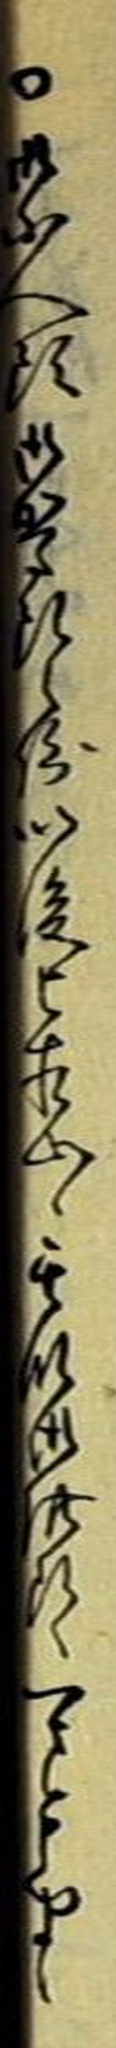○御小人頭御駕頭之儀以後被相止候其段御供頭へ可被申聞候
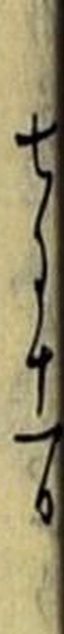七月十一日
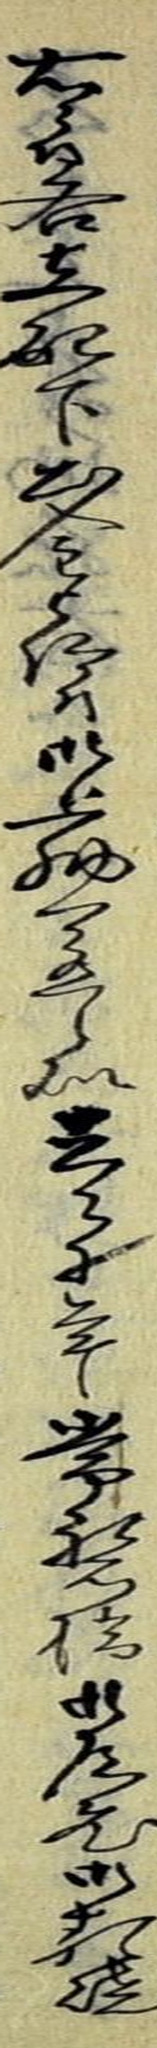右に付各支配下出金被仰付御上納可被有之処去々寅年常盤橋御屋敷御類焼
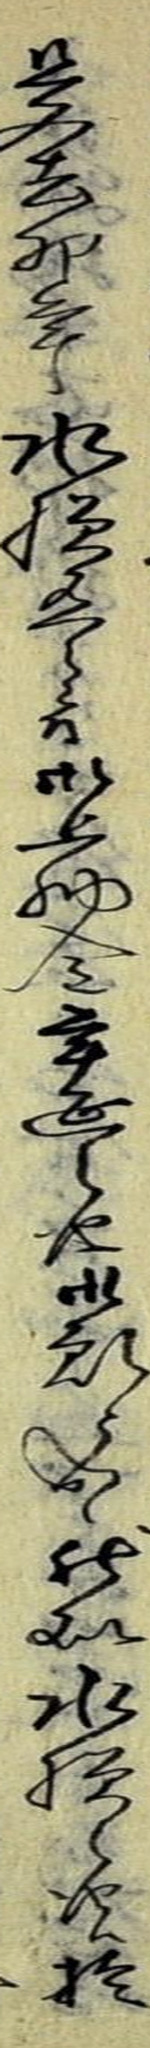且又去卯年之水損有之候に付御上納金年延之儀御願被成候然処水損之儀は於
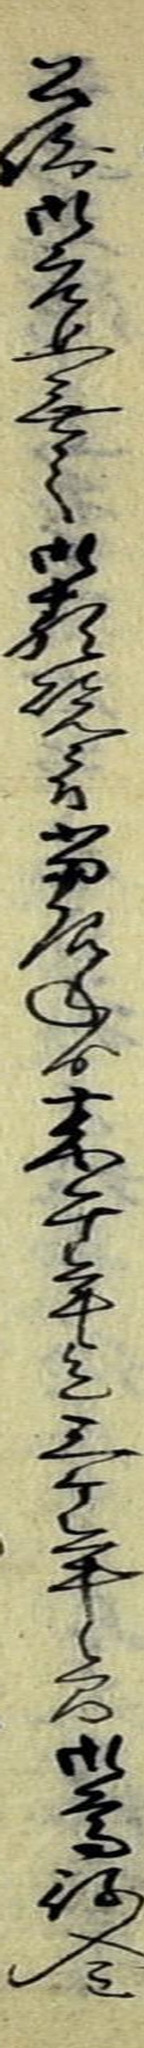公儀御取上無之御類焼に付当辰年ゟ来午年迄三ヶ年之間御高役金
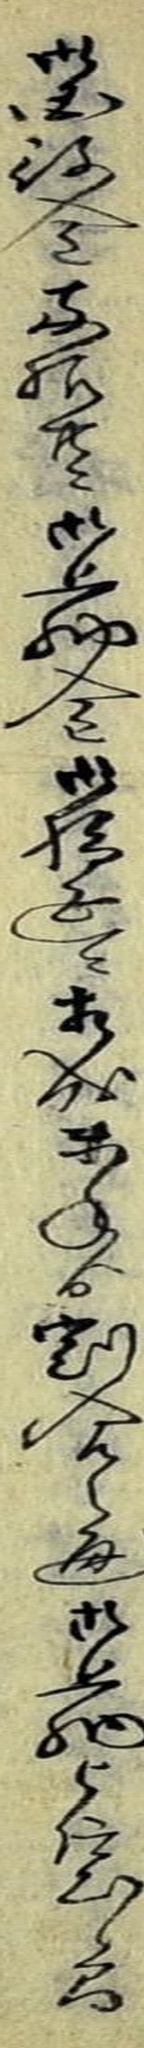御国役金両様共に御上納金御指延に相成未年ゟ割合之通御上納被仰出候間
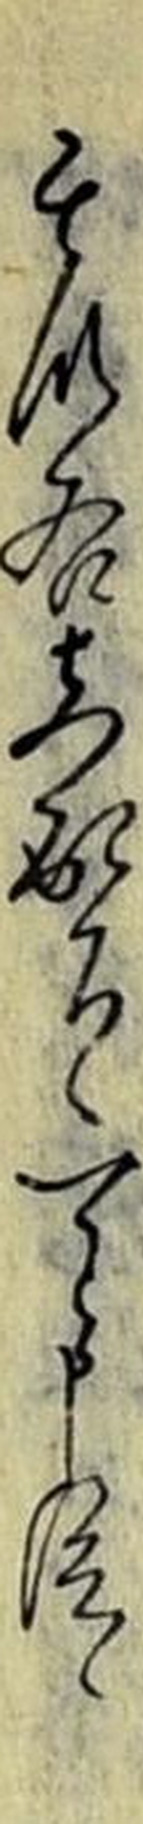其段各支配下へ可被申渡候
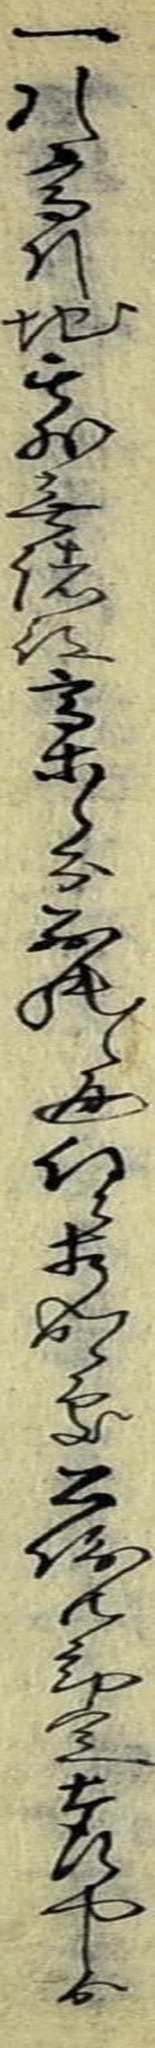一引高引地其外無諸役高等之分別紙之通伺に相成候処公儀共勘定奉行中ゟ
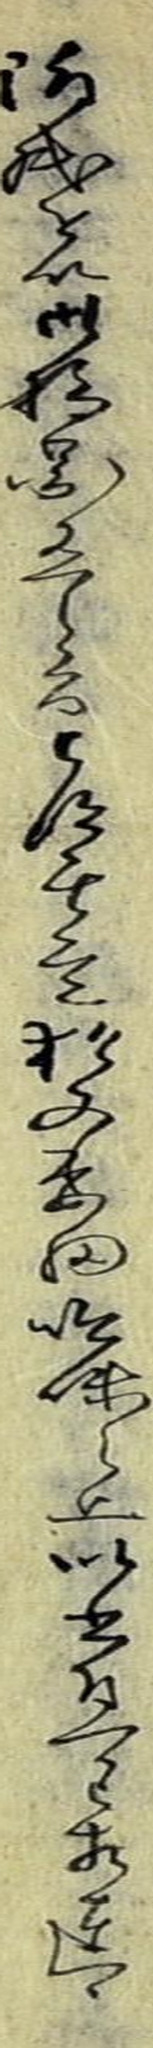附紙を以御指図有之候間被渡其節猶又委細吟味之上以書付可被相達候
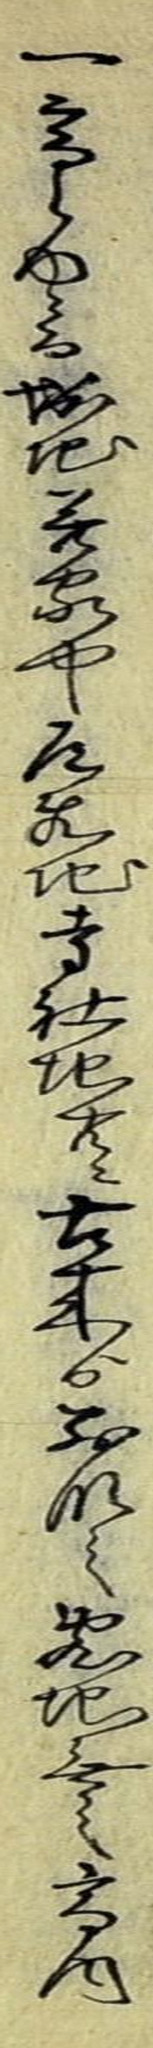一高之内に而城地并家中屋敷地寺社地共に古来ゟ別段之敷地無之高内
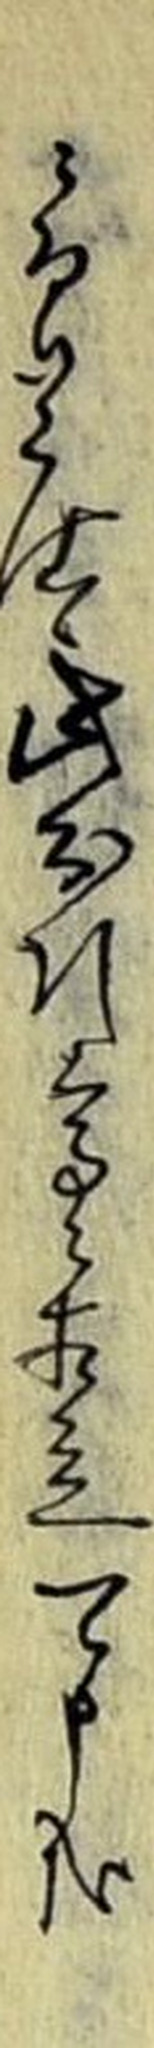に而御座候此分引当に相立可申哉
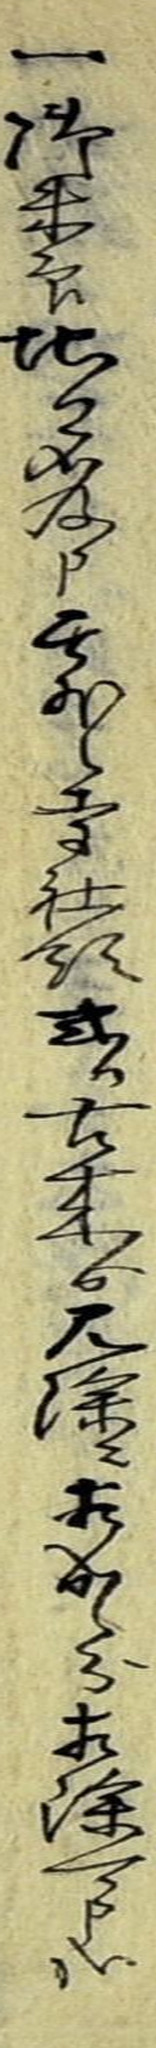一御朱印地は不及申其外之寺社領或は古来ゟ見除に相成候分相除可申哉
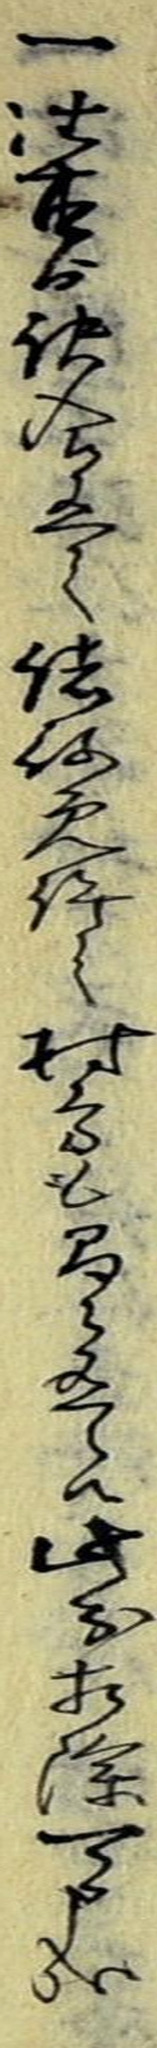一往古ゟ訳合有之諸役免許之村方も間々有之候此分相除可申哉

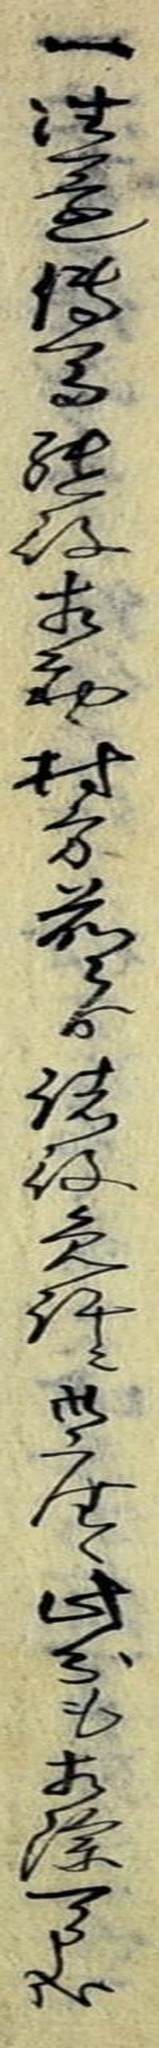一往還伝馬継役相勤候村方前々ゟ諸役免許に御座候此分も相除可申哉
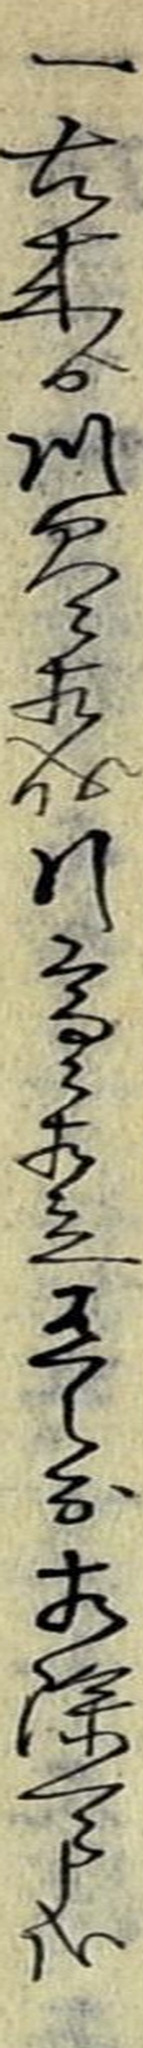一古来ゟ川欠に相成引高に相立有之分相除可申哉
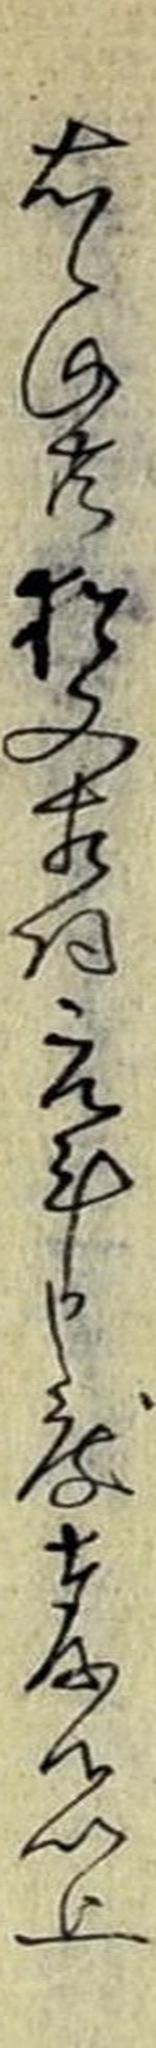右之趣共猶又相伺取斗申度奉存候以上
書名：命令之部 四
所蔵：福井県文書館 Fukui Prefectural Archives
